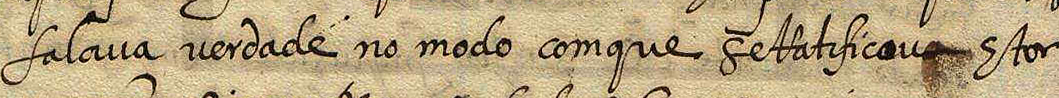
falaua uerdade no modo com que se Ratificou E tor
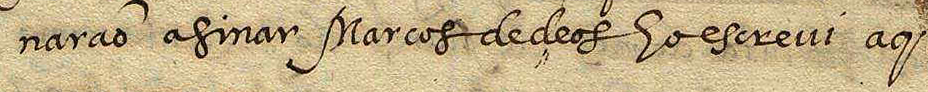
naraõ asinar Marcos de deos ho escreui aq̄
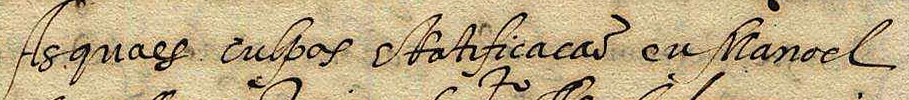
As quaes culpas E Ratificaçaõ eu Manoel
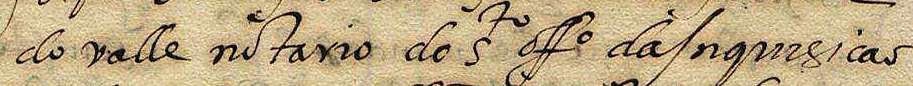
do valle notario do sto offo da Jnquisição
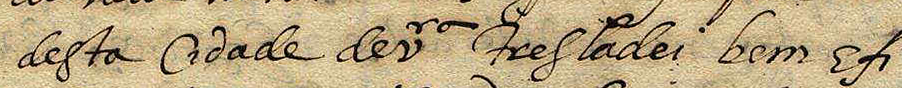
desta Cidade devra tresladei bem E fi
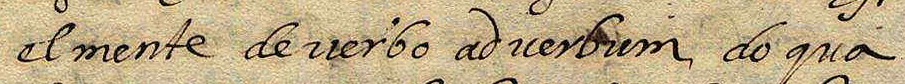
elmente de uerbo ad uerbum do qua
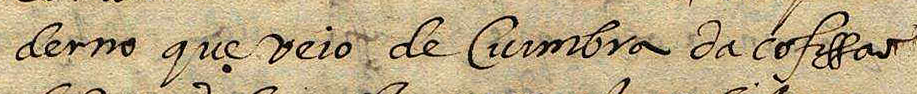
derno que veio de Cuimbra da cōfissaõ
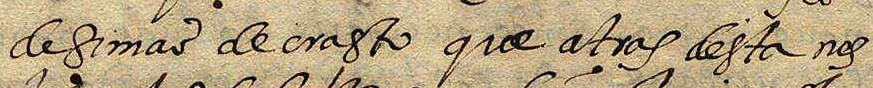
de Simaõ de crasto que atras desta nes
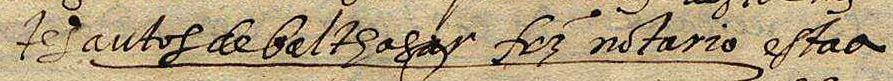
tes autos de balthasar frz̄ notario estaa
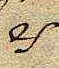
es
